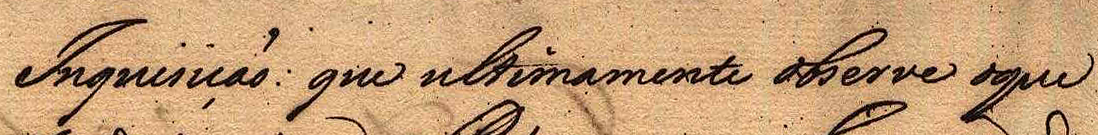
Inquisiçaõ: que ultimamente observe o que
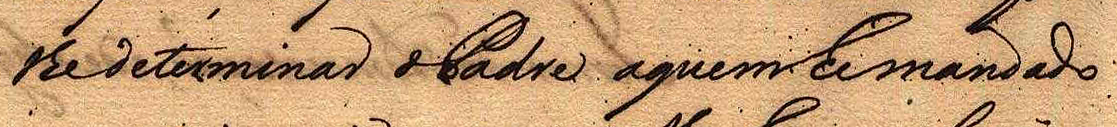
lhe determinar o Padre a quem he mandado
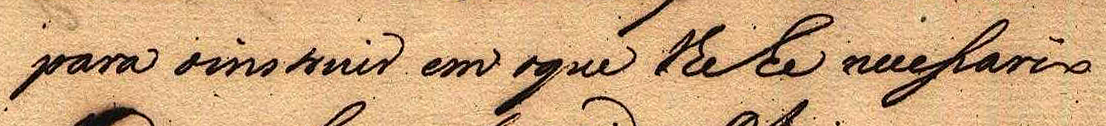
para o instruir em o que lhe he necessario
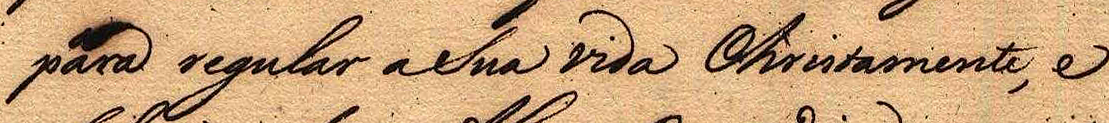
para regular a Sua vida Christamente, e
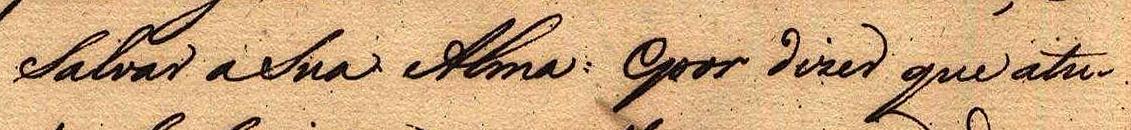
Salvar a Sua Alma: e por dizer que a tu
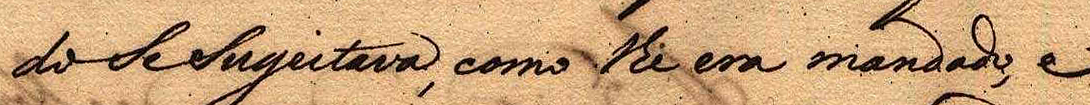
do Se Sugeitava como lhi era mandado, e
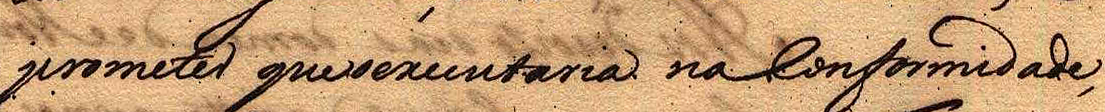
prometer que o executaria na Conformidade,
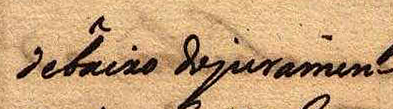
debaixo do juramen
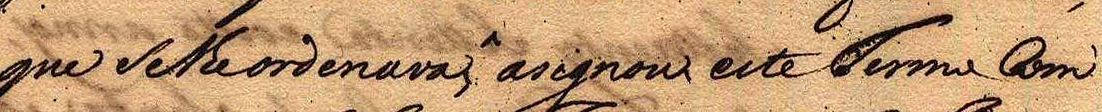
que se lhe ordenavaõ asignou este Termo Com
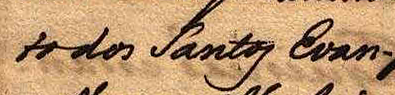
to dos Santos Evan
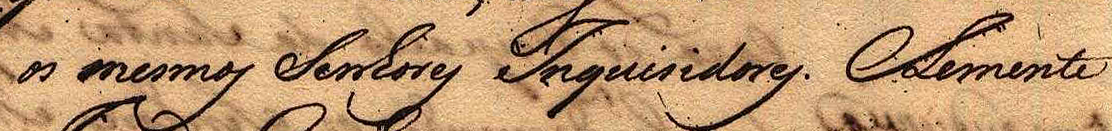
os mesmos Senhores Inquisidores. Clemente
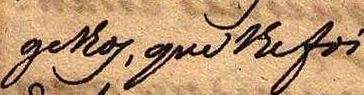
gelhos, que lhe foi
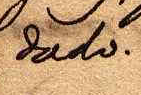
dado.
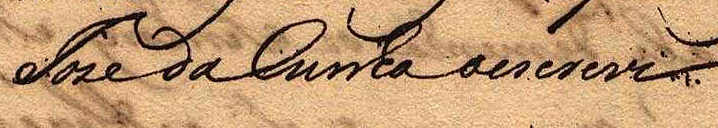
Ioze da Cunha o escrevi
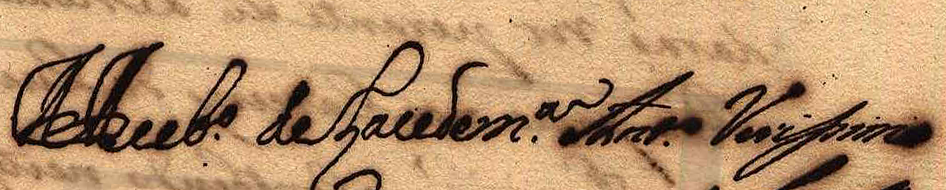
A Arceb.o de Lacedem.ar Ant.o Verissimo
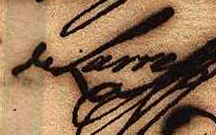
de Larre
